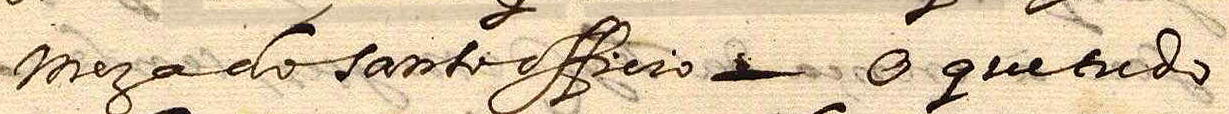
meza do santo officio - O que tudo
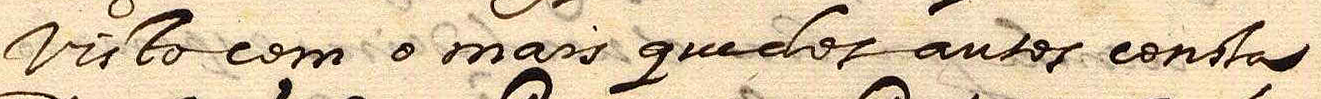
visto com o mais que dos autos consta,
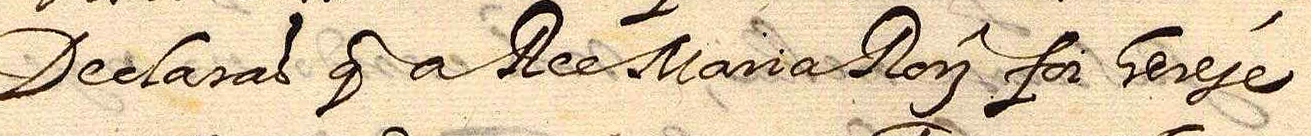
Declaraõ q̄ a Ree Maria Roiz̄ foi herege
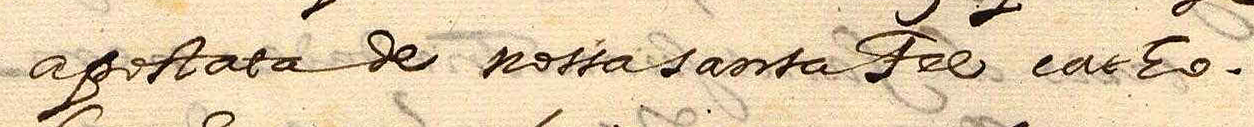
apostata de nossa santa Fee catho
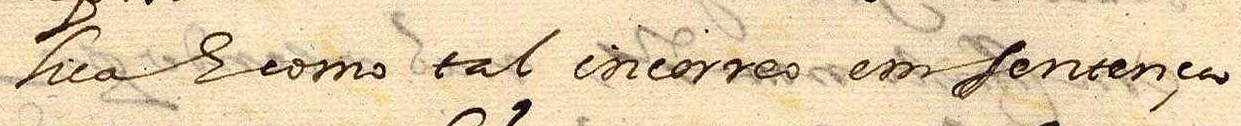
lica E como tal incorreo em sentença
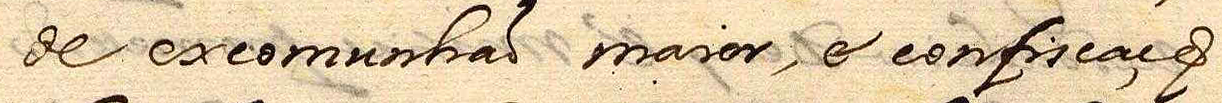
de excomunhaõ maior, & confiscaçaõ
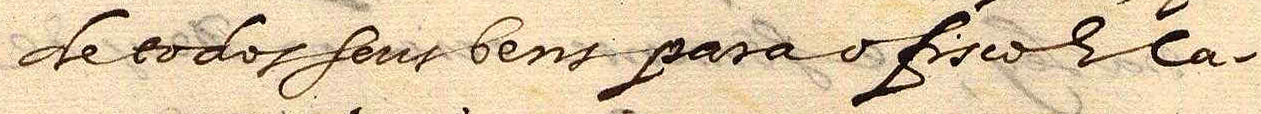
de todos seus bens para o fisco E ca
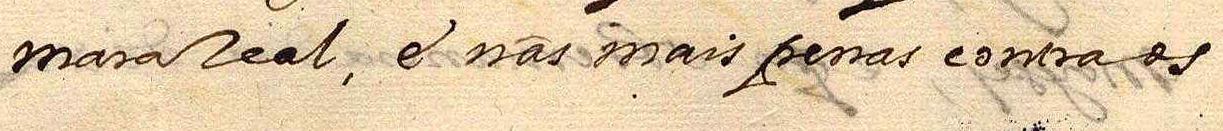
mara Real, & nas mais penas contra os
